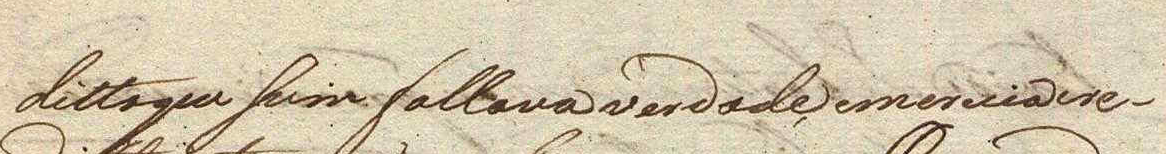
ditto que ssim fallava verdade, e merecia cre
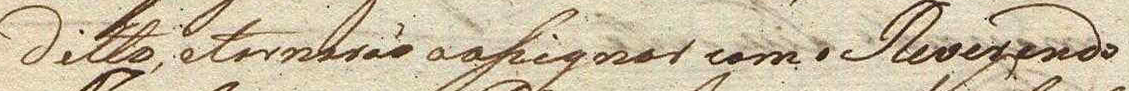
ditto, e tornaraõ a assignar com o Reverendo
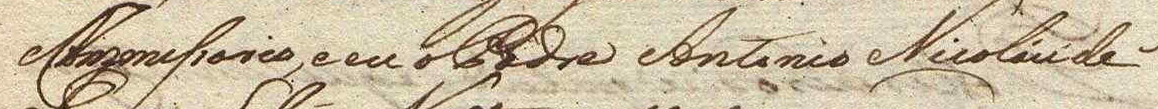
Commissario, e eu o Padre Antonio Nicoláu de
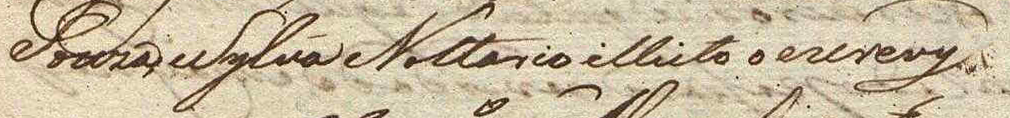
Souza, e Sylua Nottario illeito o escrevy.
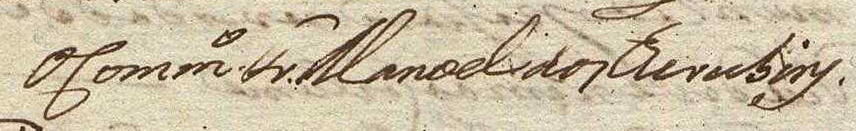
O Comm.o Fr. Manoel dos Cherubins.
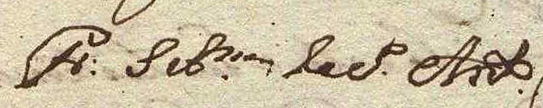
Fr: Seb.m de S. Anto.
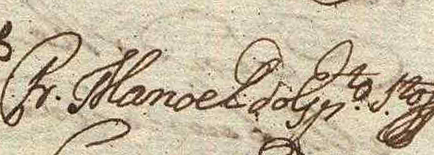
Fr. Manoel do Esp.to s.to
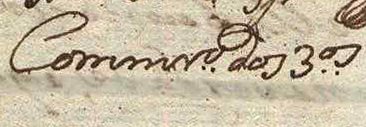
Commr.o dos 3.os
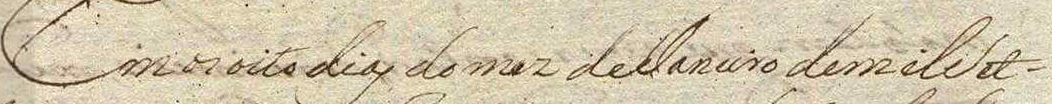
Em os oito dias do mez de Ianeiro de mil Se
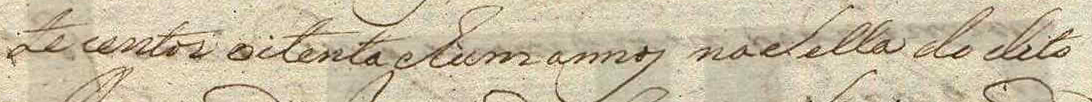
tecentoz oitenta e hum annos na Sella do dito
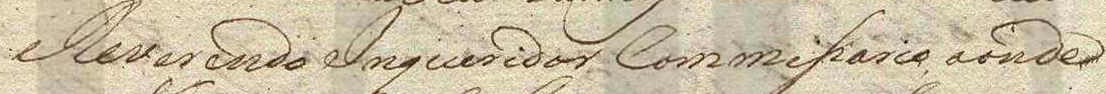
Reverendo Inquiridor Commissario, aonde
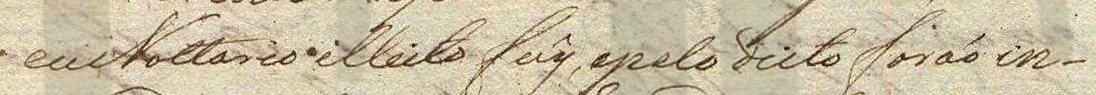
eu Nottario illeito fuy, e pelo dicto foraõ in
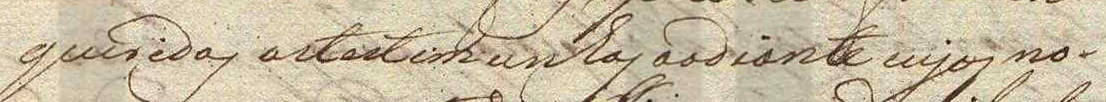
queridas as testimunhas ao diante cujos no
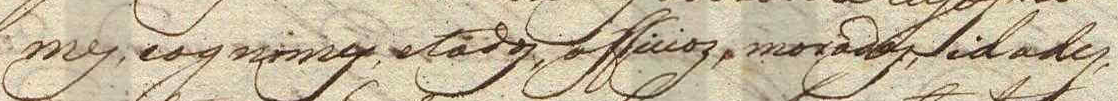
mes, cognomes, e todos officioz, moradas, idades,
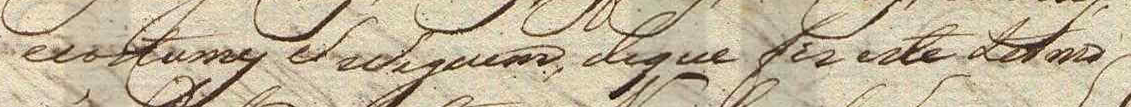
e costumes Se seguem, de que fiz este termo
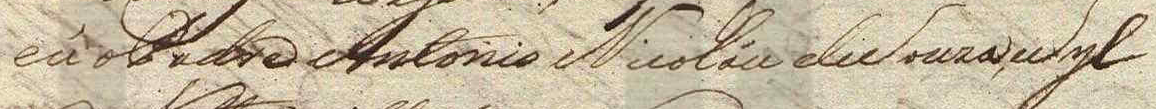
eu o Padre Antonio Nioláu de Souza, e Syl
